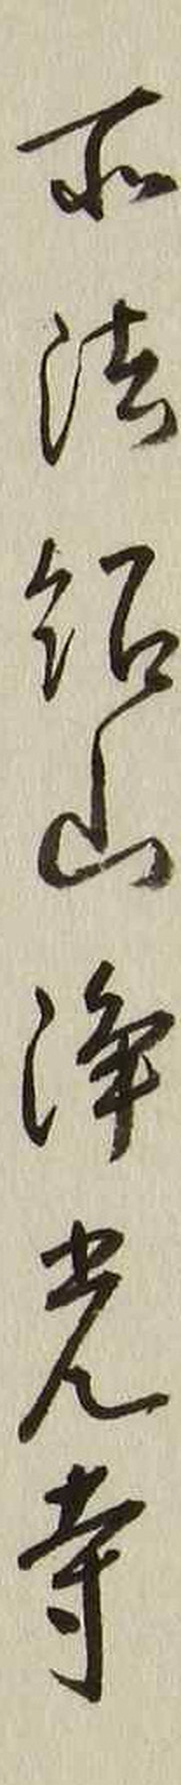所法紹山浄光寺
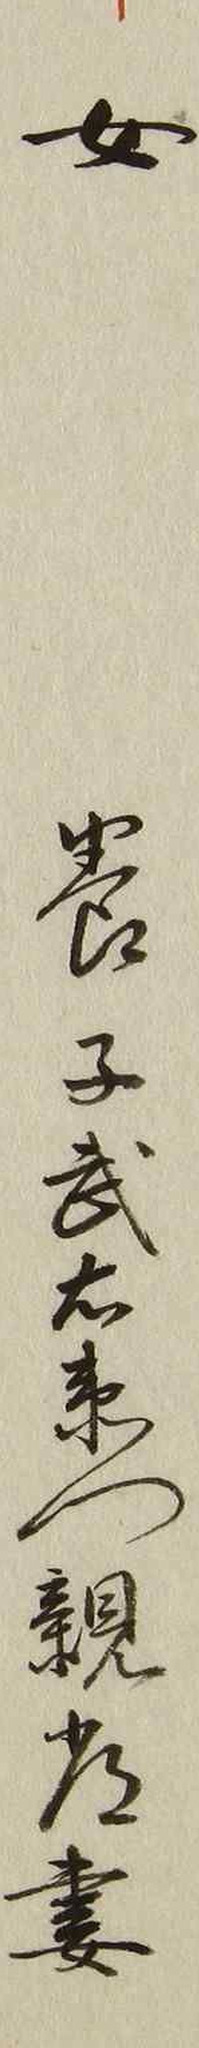女養子武右衛門親常妻
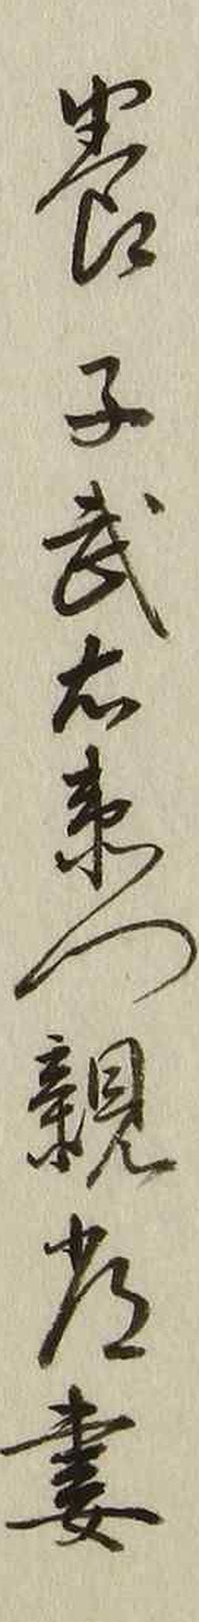女養子武右衛門親常妻
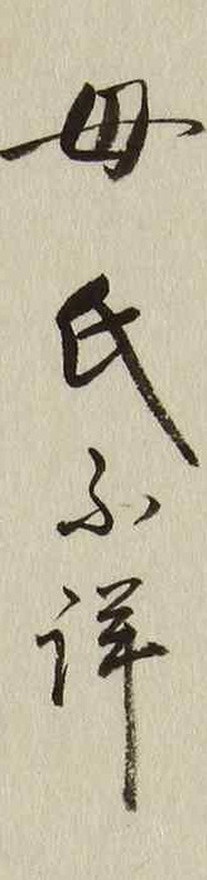母氏不詳
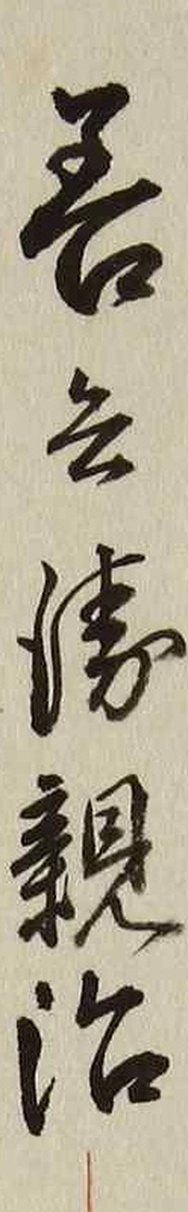善兵衛親治
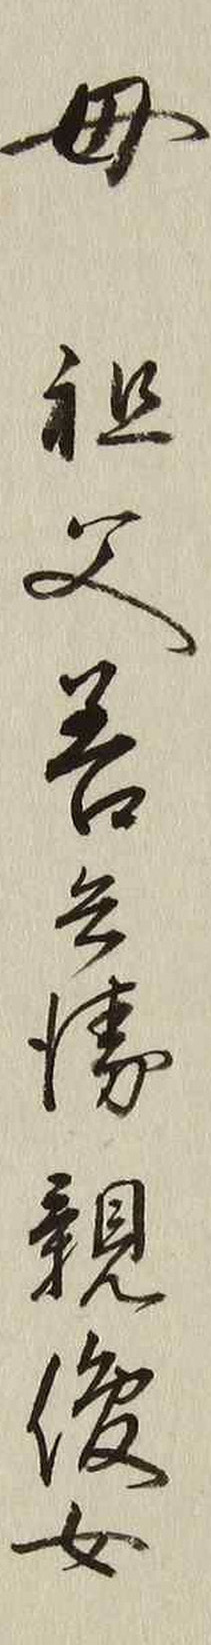母祖又善兵衛親俊女
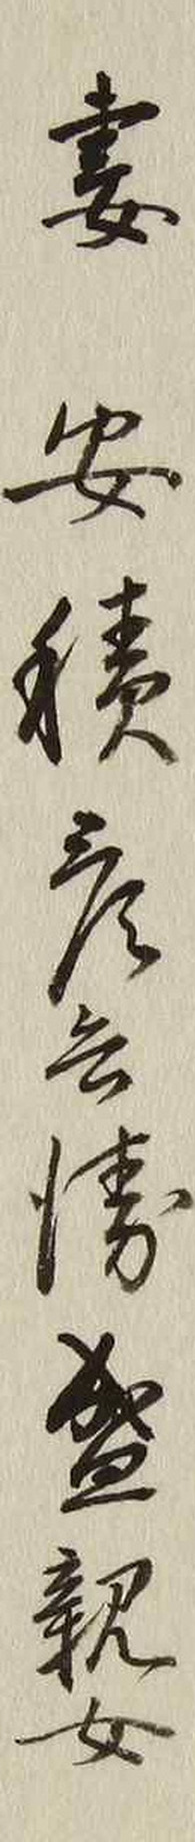妻安積彦兵衛盛親女
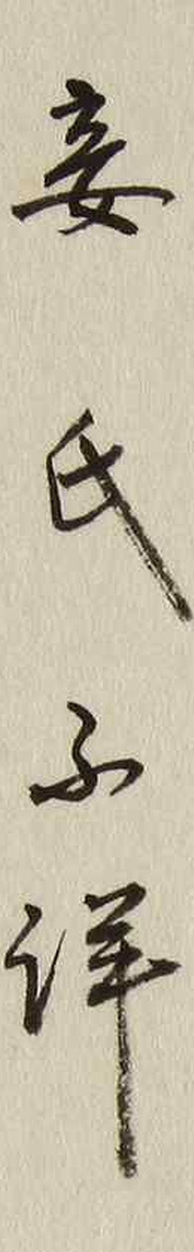妾氏不詳
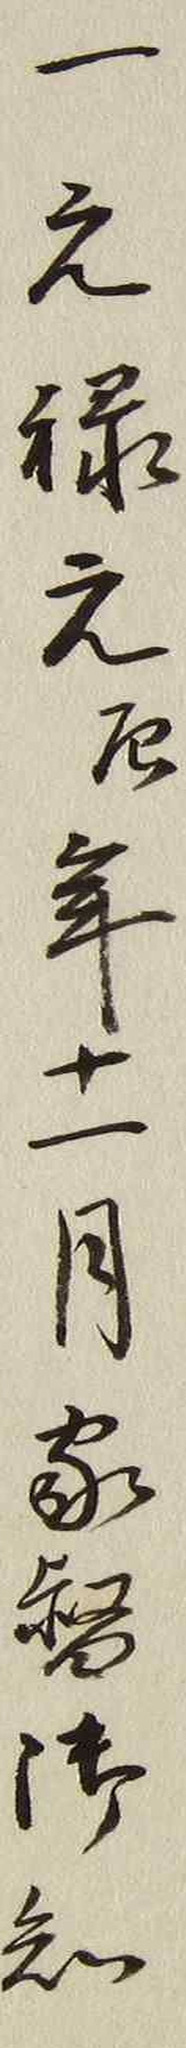一元禄元辰年十一月家督御知
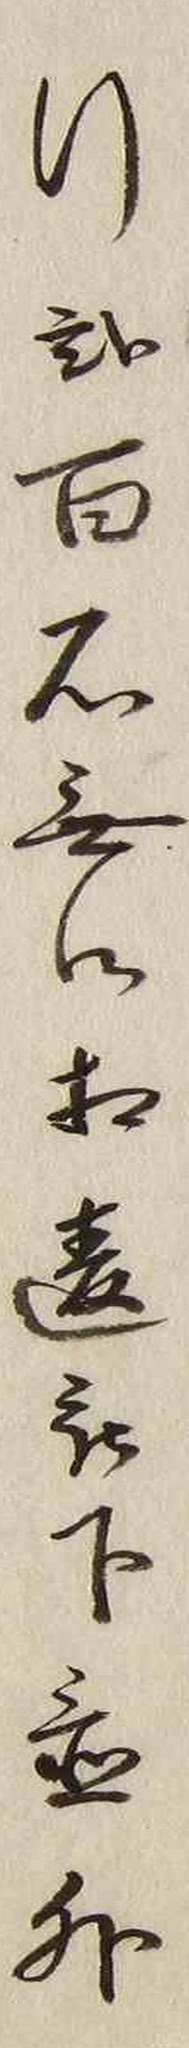行弐百石無御相違被下置外
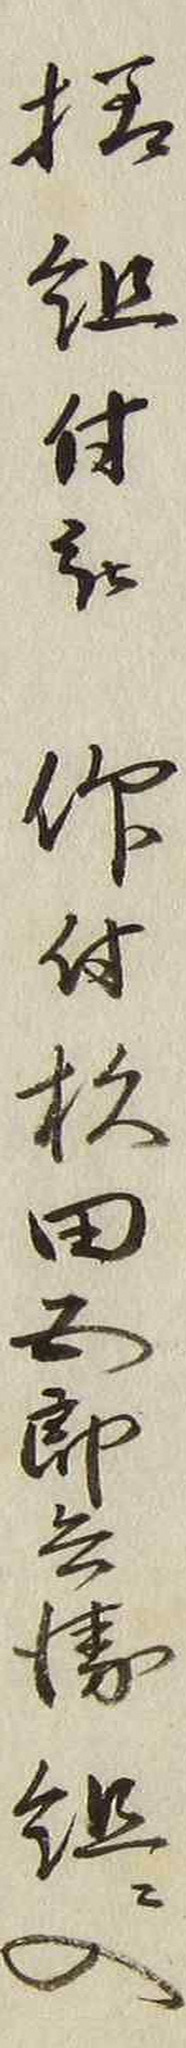様組付被仰付杉田五郎兵衛組ニ入
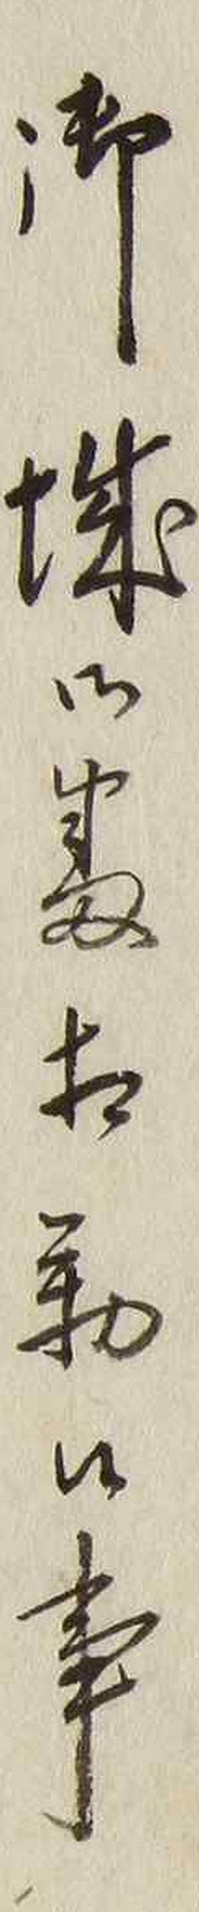御城御番相勤候事

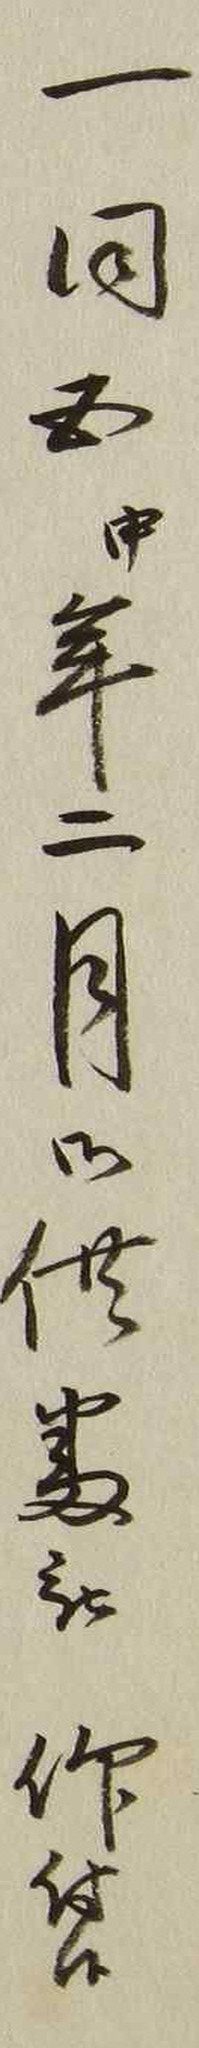一同五申年二月御供番被仰付候
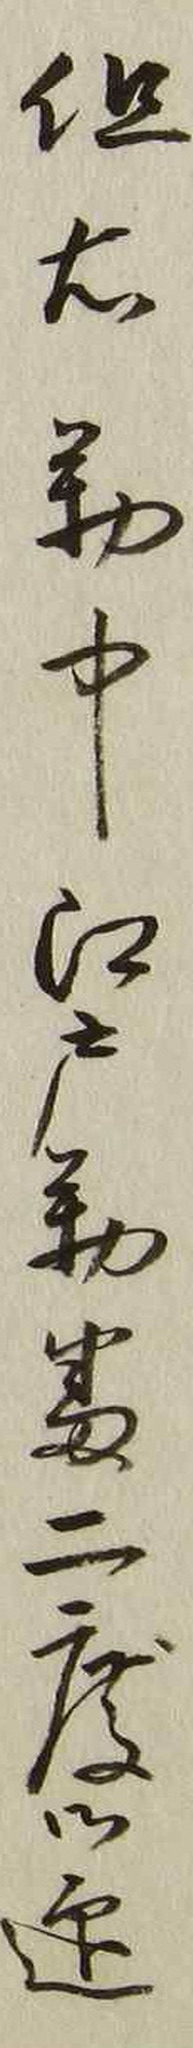但右勤中江戸勤番二度御迎
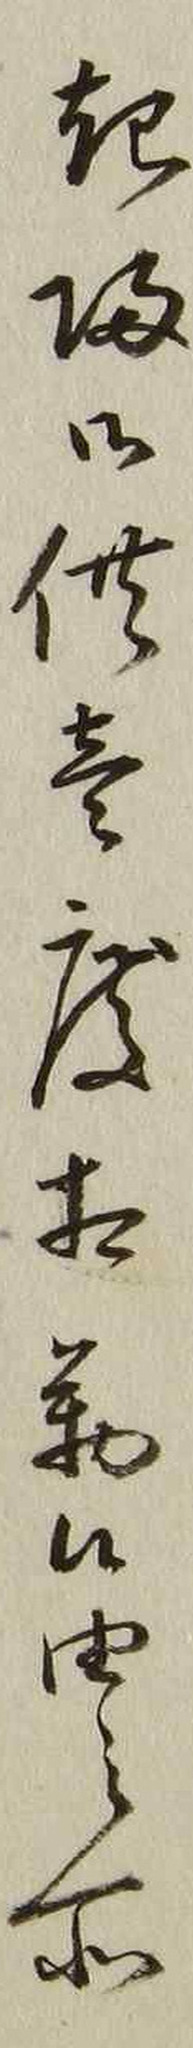起帰御供壱度相万候由之所
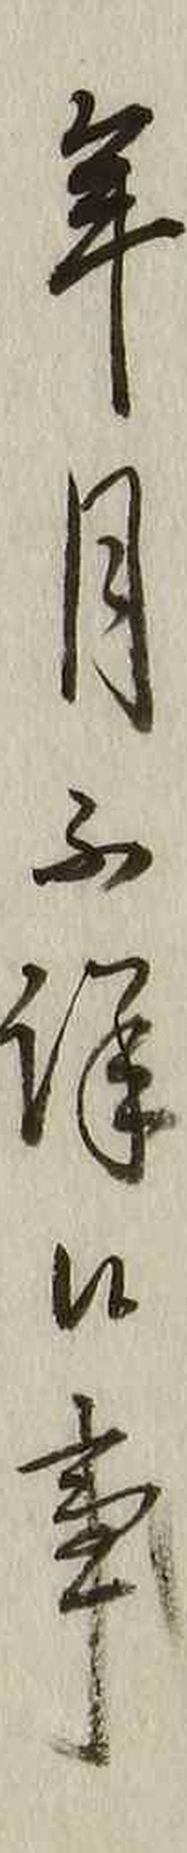年月不詳候事
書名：諸士系譜　巻之149　そ之部2
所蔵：会津若松市立会津図書館
